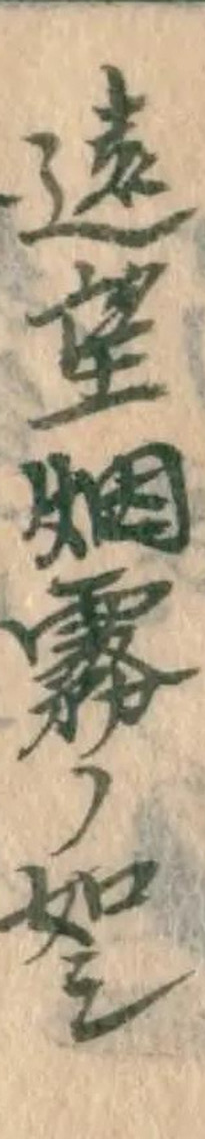遠望烟霧ノ如シ
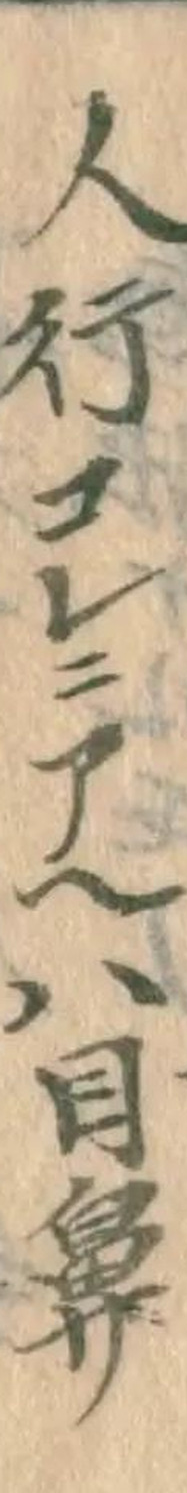人行コレニアヘハ目鼻
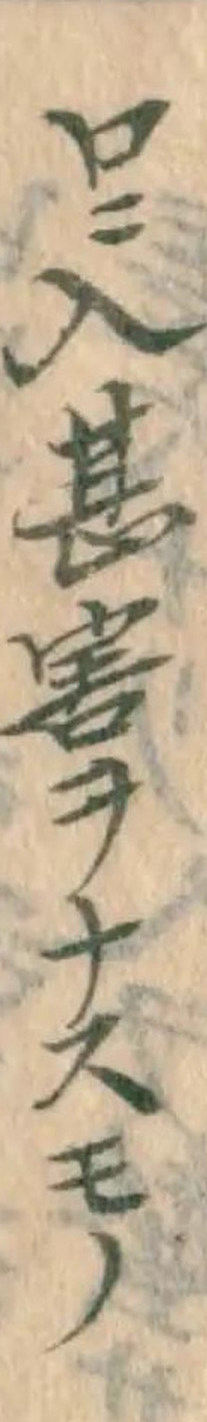口ニ入甚害ヲナスモノ
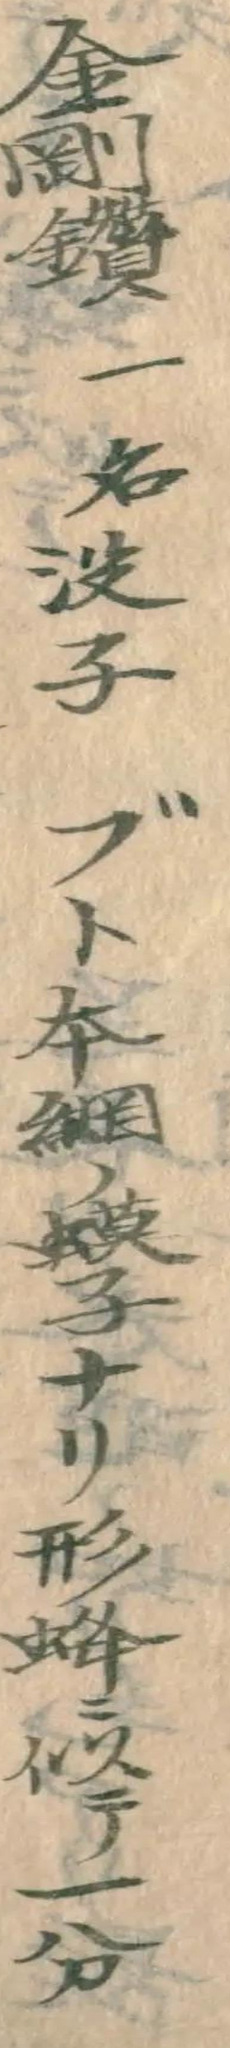金剛鑚一名没子ブト本綱ノ蟆子ナリ形蜂ニ似テ一分
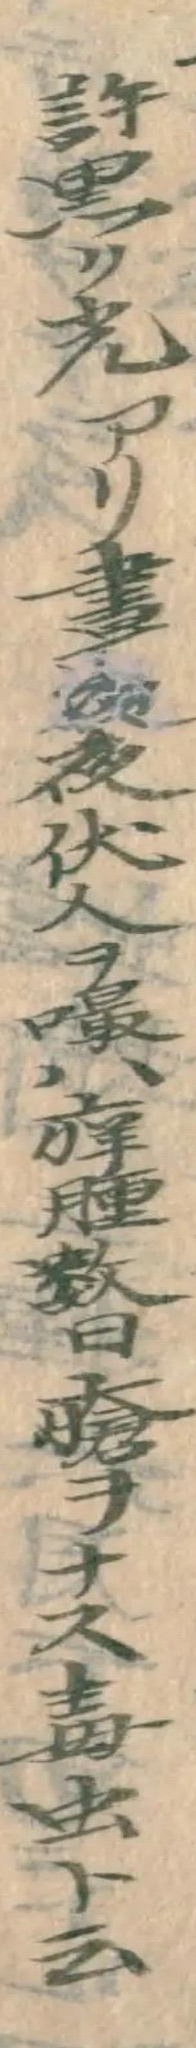許黒ク光アリ昼夜伏人ヲ嘬ハ痒腫数日瘡ヲナス毒虫ト云

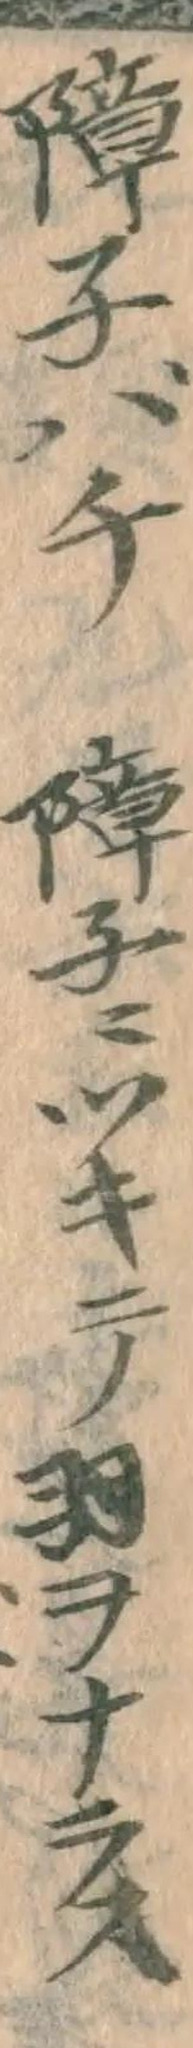障子バチ障子ニツキテ羽ヲナラス
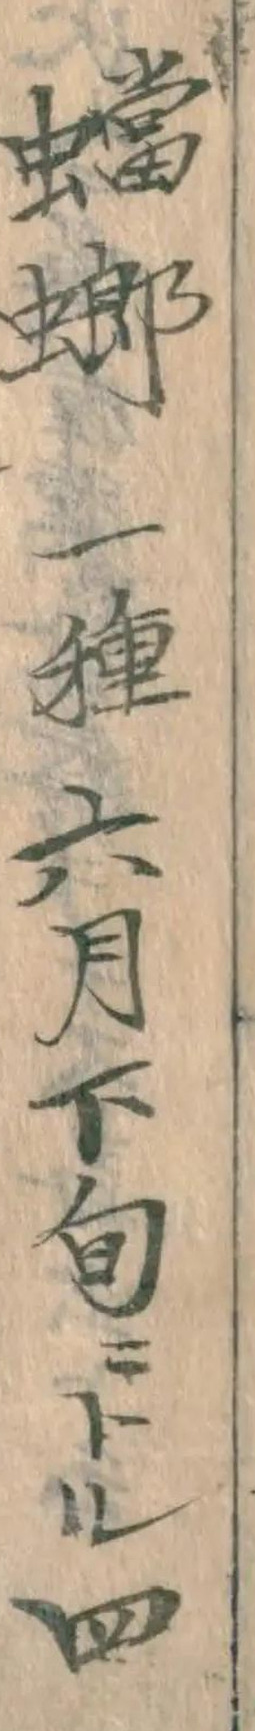蟷螂一種六月下旬ニトル四
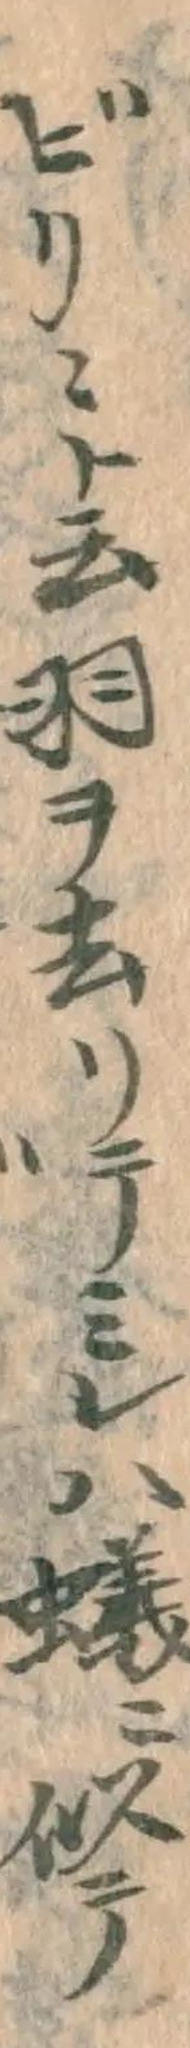ビリ々ト云羽ヲ去リテミレハ蟻ニ似テ
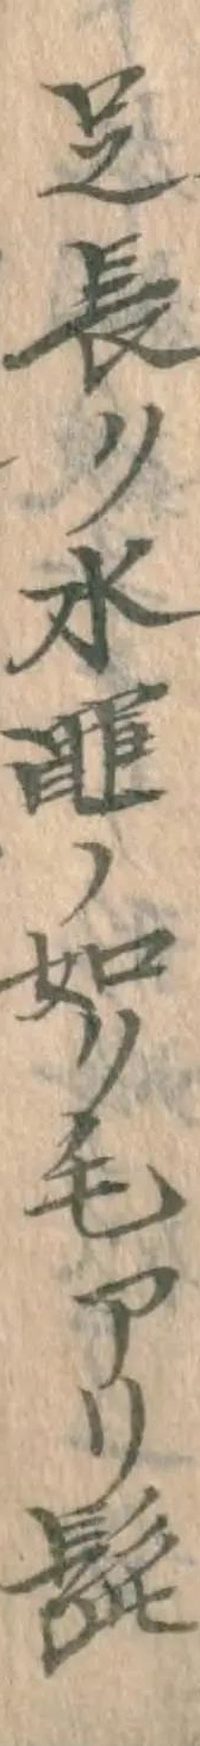足長ク水黽ノ如ク毛アリ髭
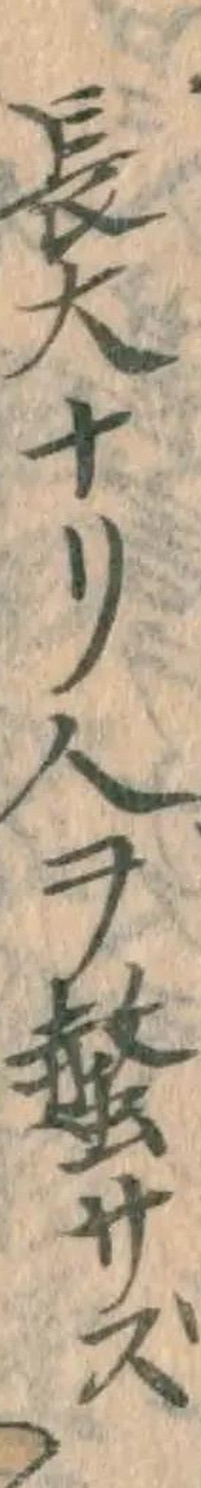長大ナリ人ヲ螫サズ
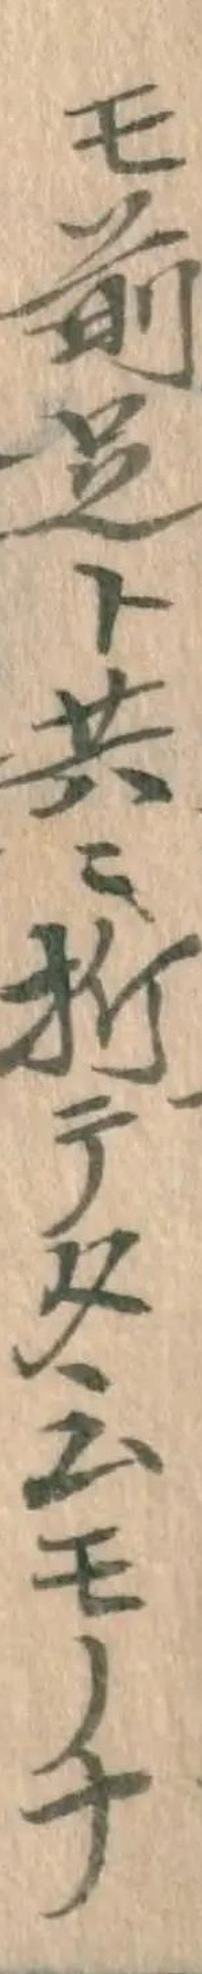モ前足ト共ニ折テタヽムモノナ
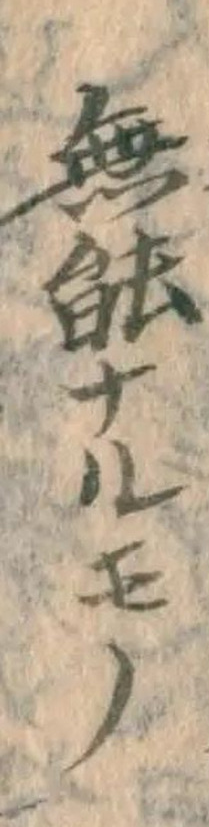無能ナルモノ
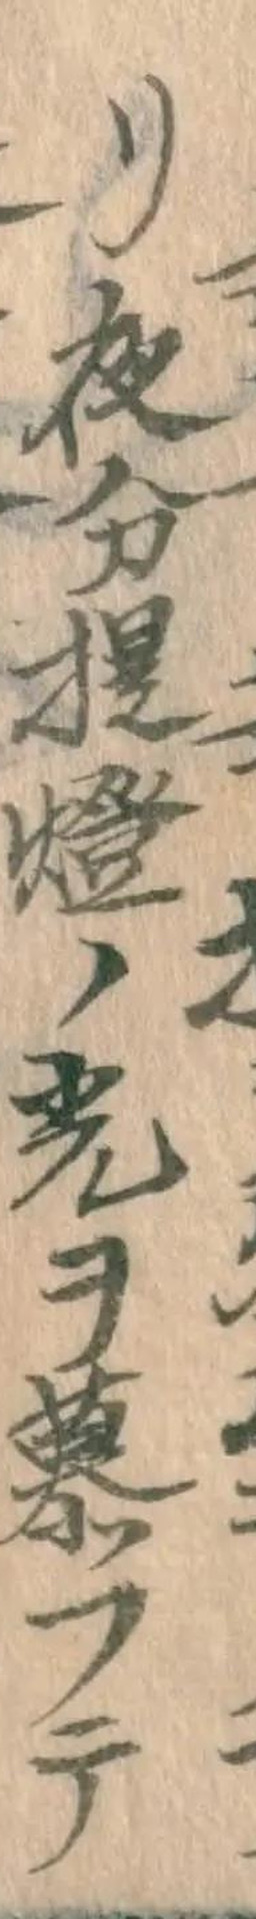リ夜分提燈ノ光ヲ慕フテ
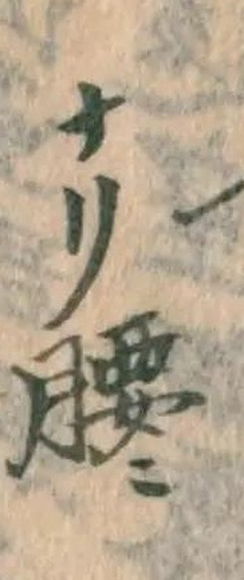ナリ腰ニ
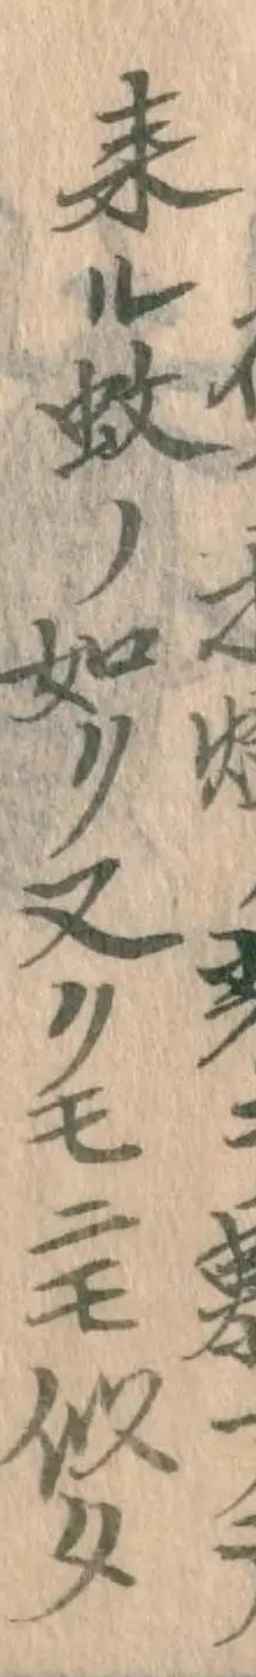来ル蚊ノ如ク又クモニモ似タ
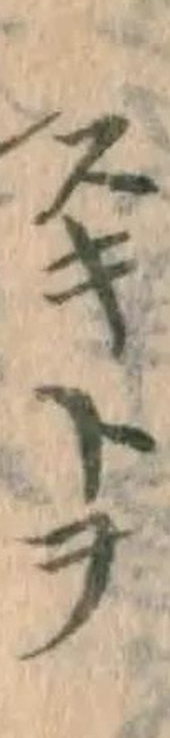スキトヲ
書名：千蟲譜 3巻. [3]
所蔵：国立国会図書館 National Diet Library, JAPAN
